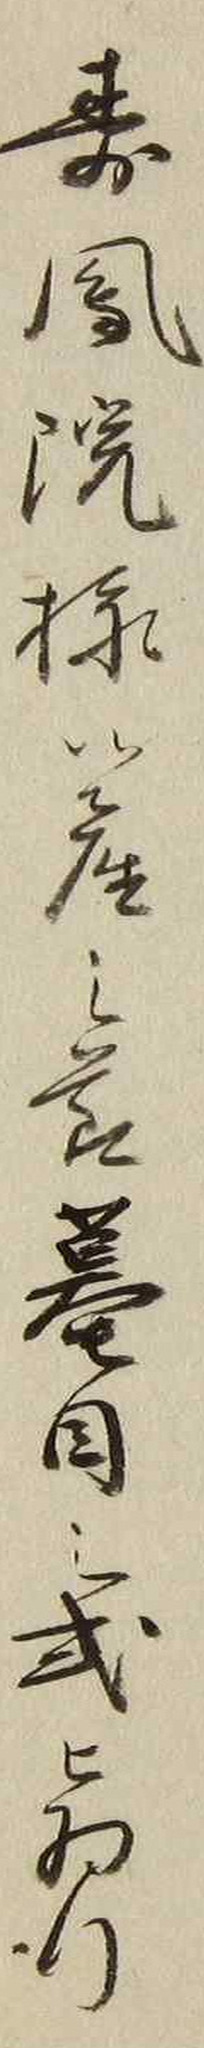寿鳳院様御産之節蟇目之式被為行
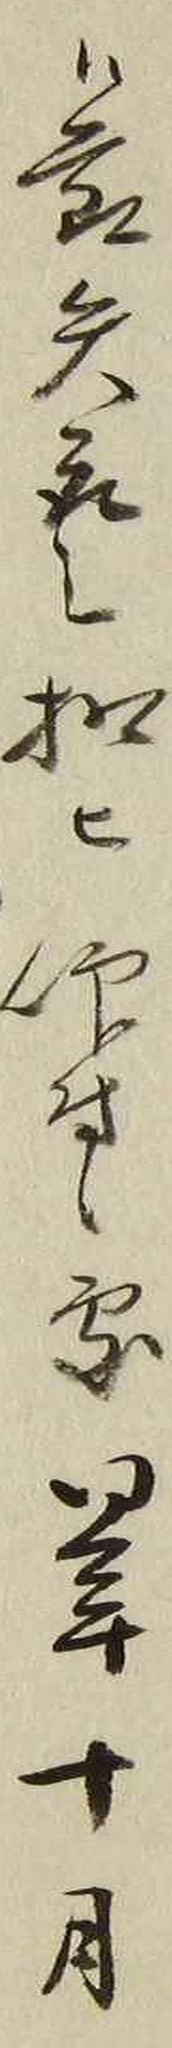候節矢取之扣被仰付候処同年十月
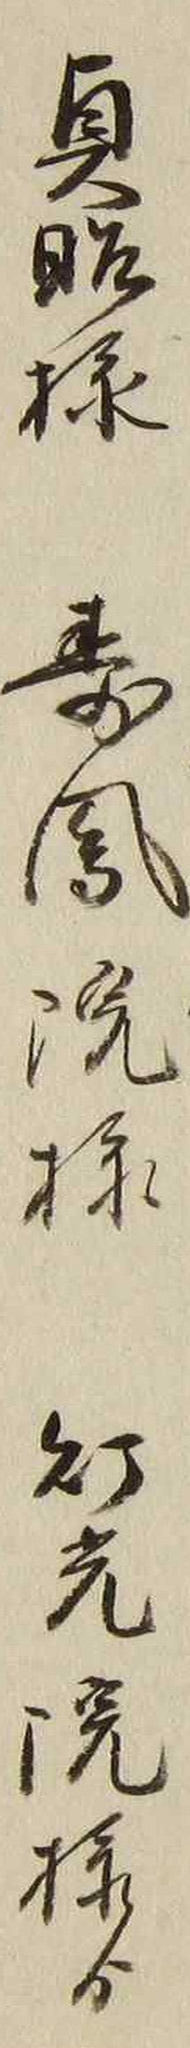貞昭様寿鳳院様幻光院様ゟ
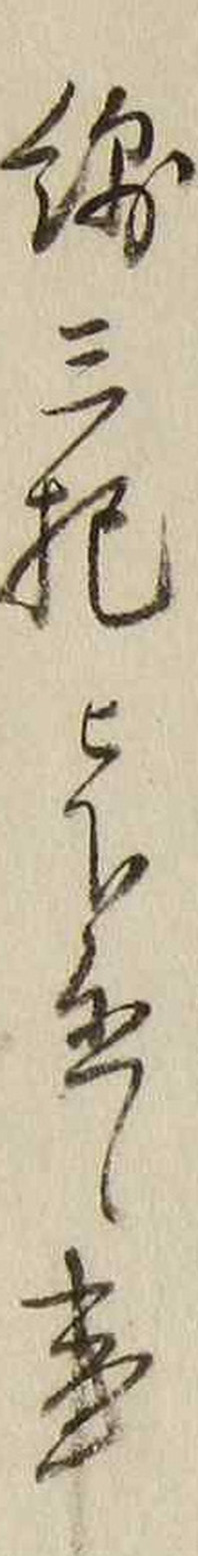綿三把被下置候事
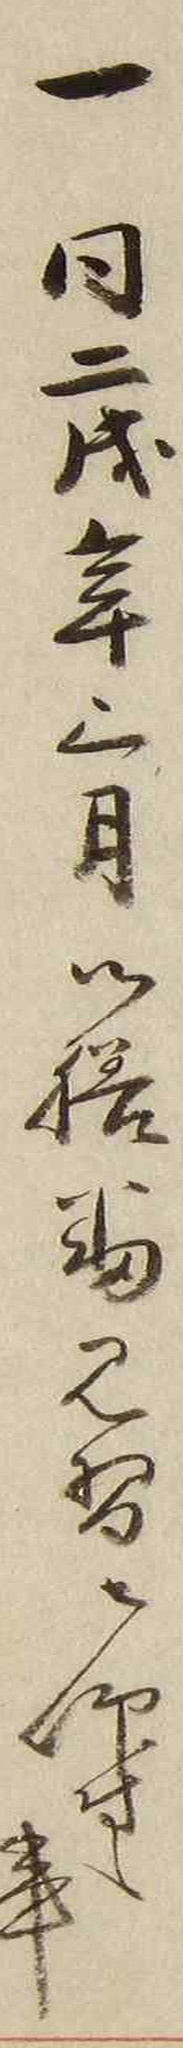一同二戌年三月御膳番見習被仰付候事

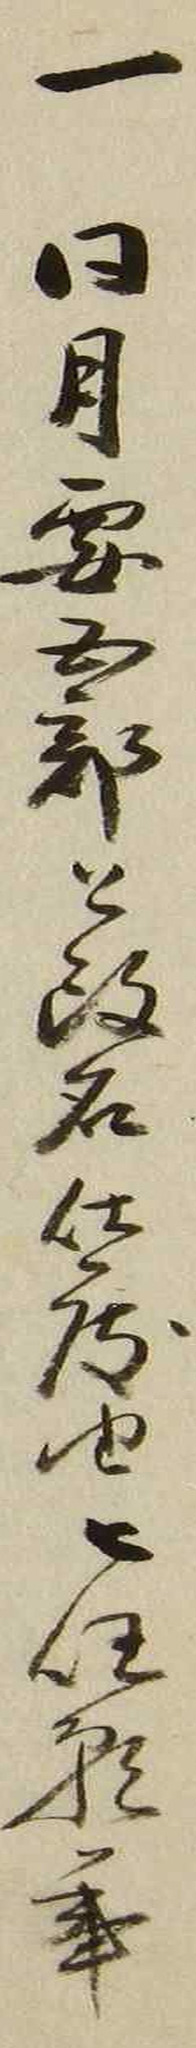一同月要五郎と改名仕度由被任願候事
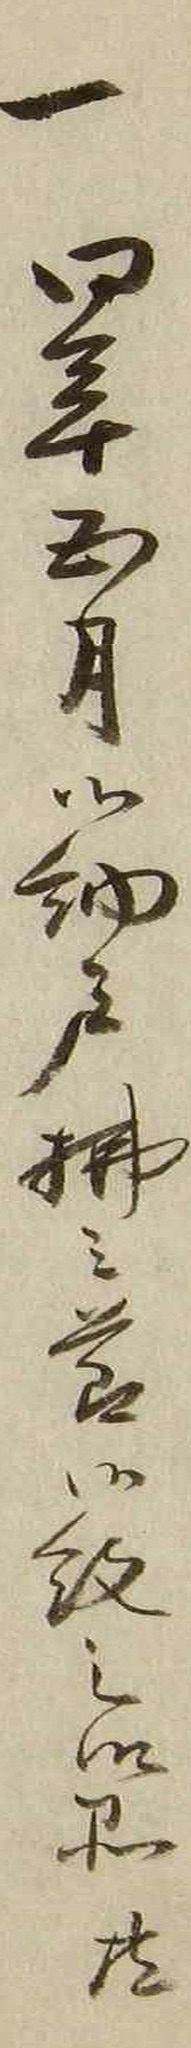一同年五月御納戸払之節御紋之御品共
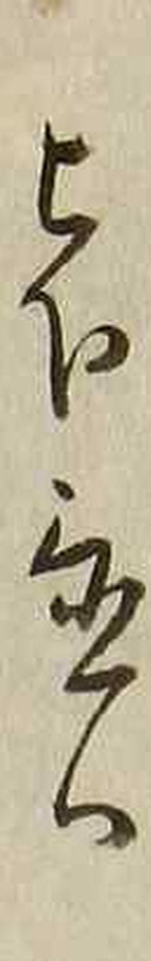被下置候
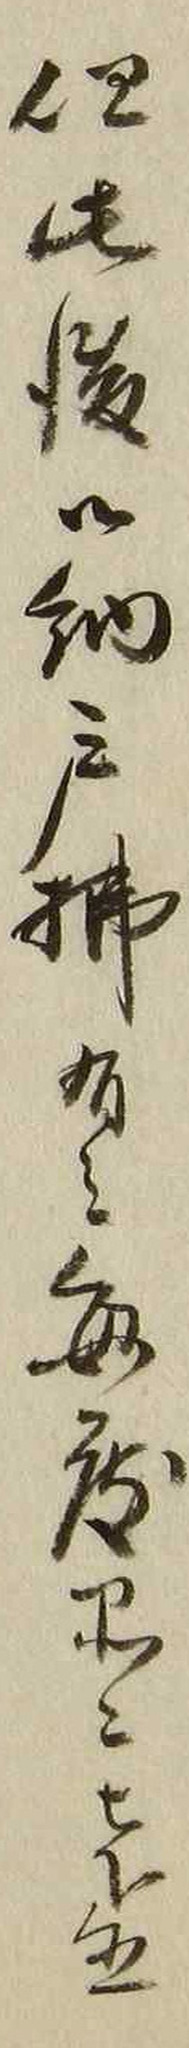但此後御納戸払有之毎度品々被下置
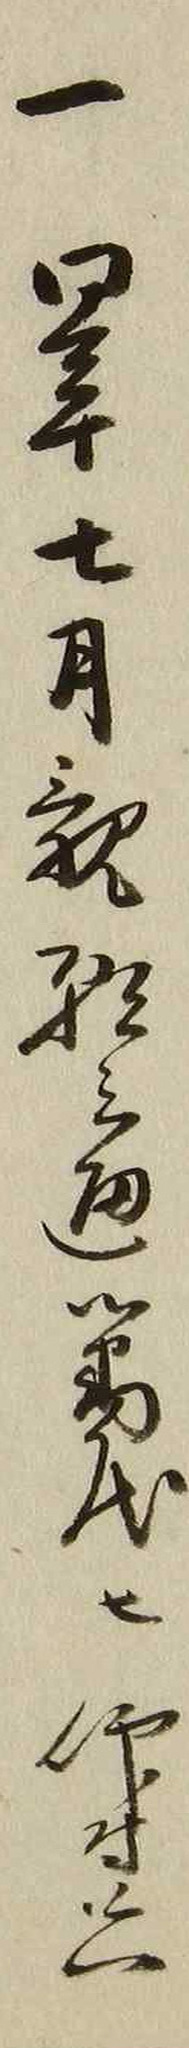一同年七月親願之通御番代被仰付只
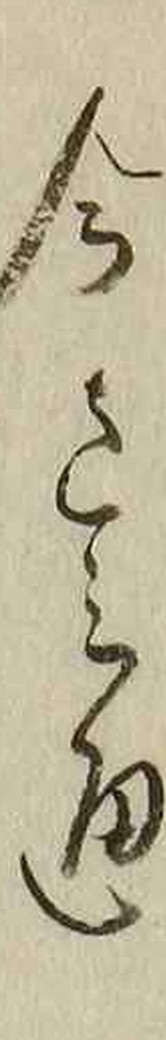今迄之通
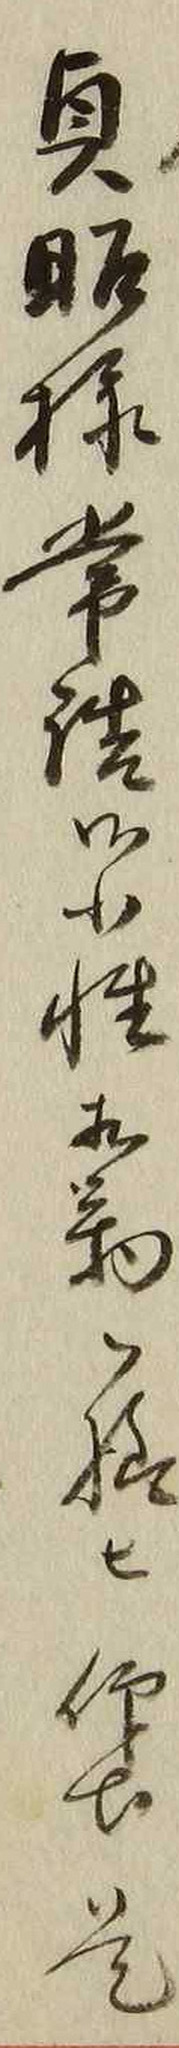貞昭様常詰御小性相勤候様被仰出是
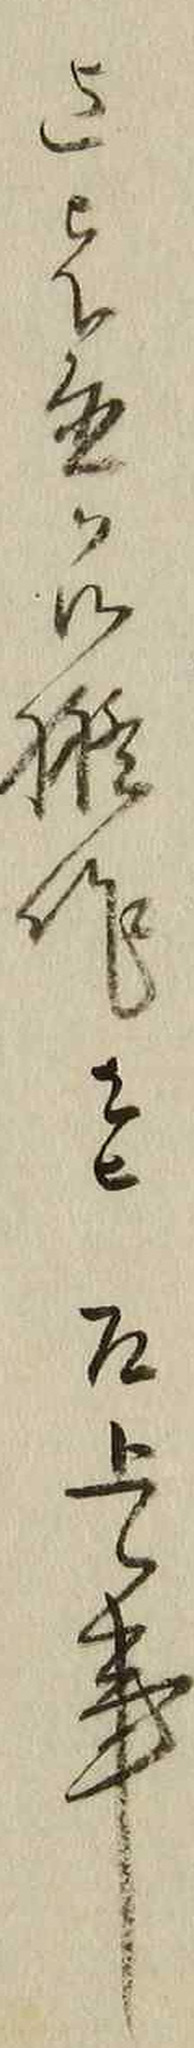迄被下置候御擬作者被召上候事
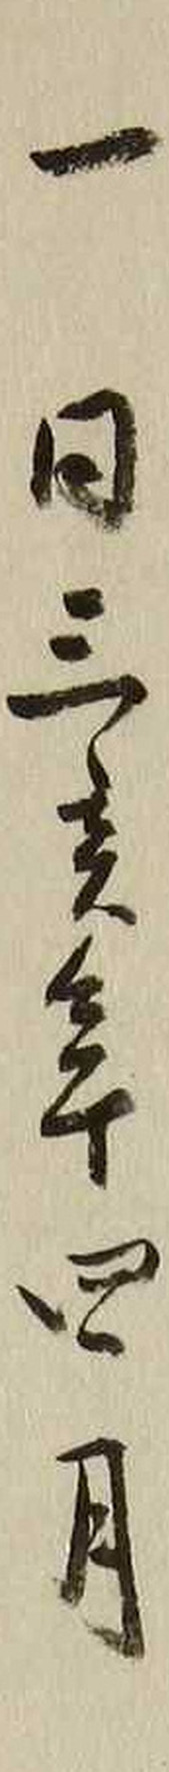一同三亥年四月
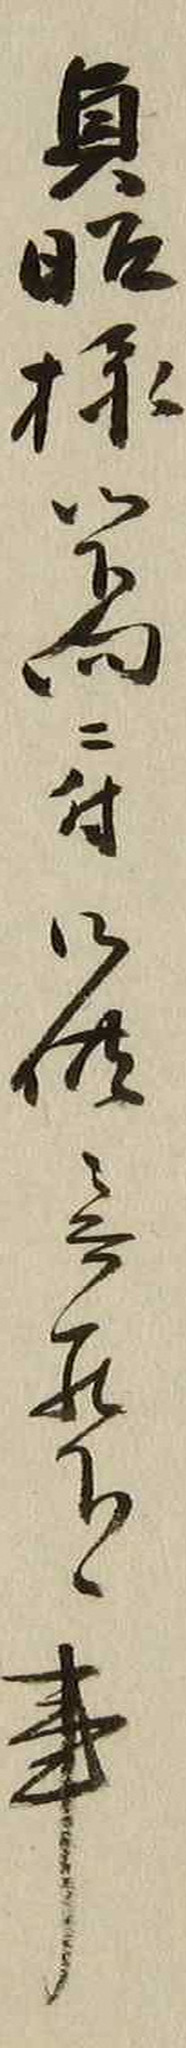貞昭様御下向ニ付御供ニ而罷下候事
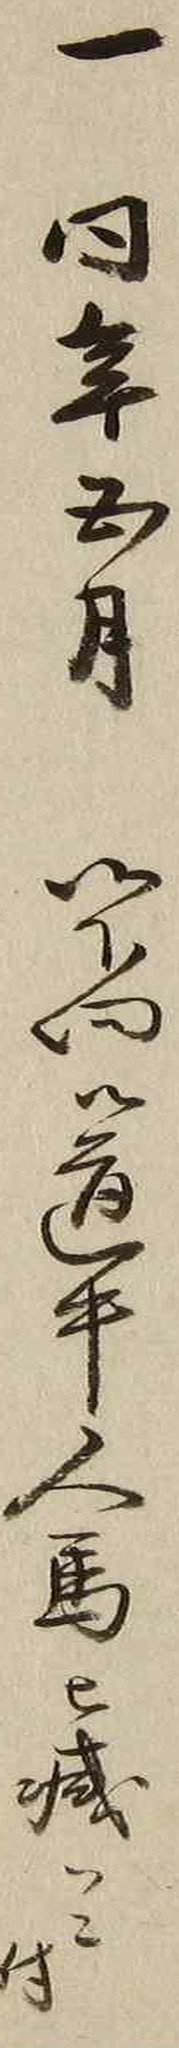一同年五月御下向御道中神馬被減候ニ付
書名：諸士系譜　巻之311　し之部1
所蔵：会津若松市立会津図書館
